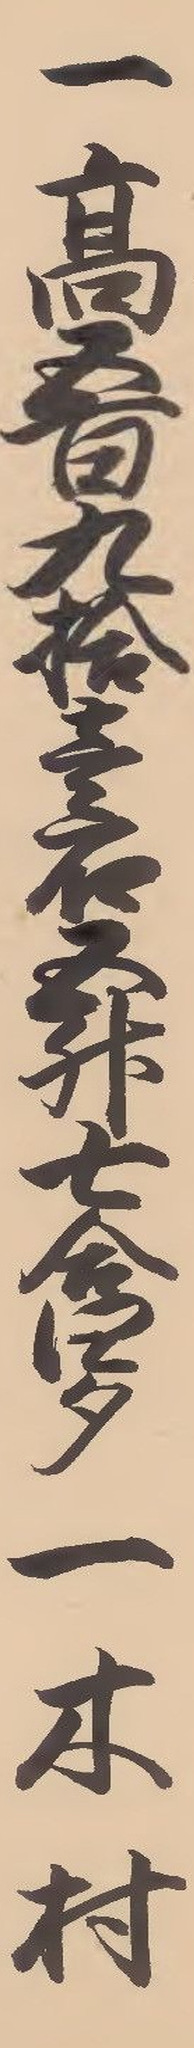一高五百九拾壱石五升七合四勺一木村
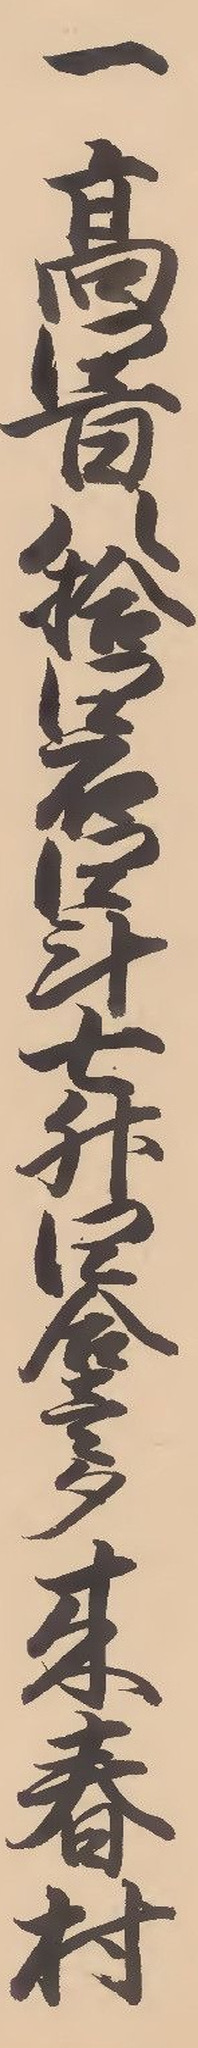一高四百八拾四国四斗七升四合壱勺来春村
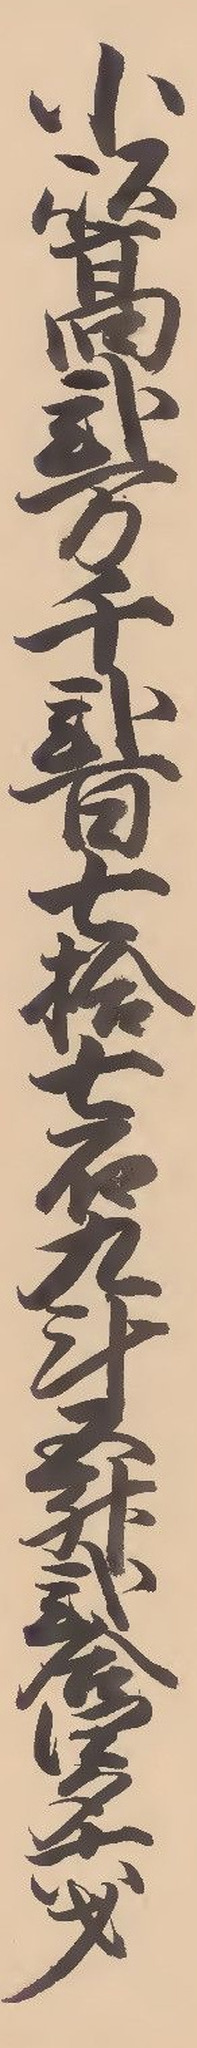小以高弐万千弐百七拾七石九斗五升弐合四勺六才

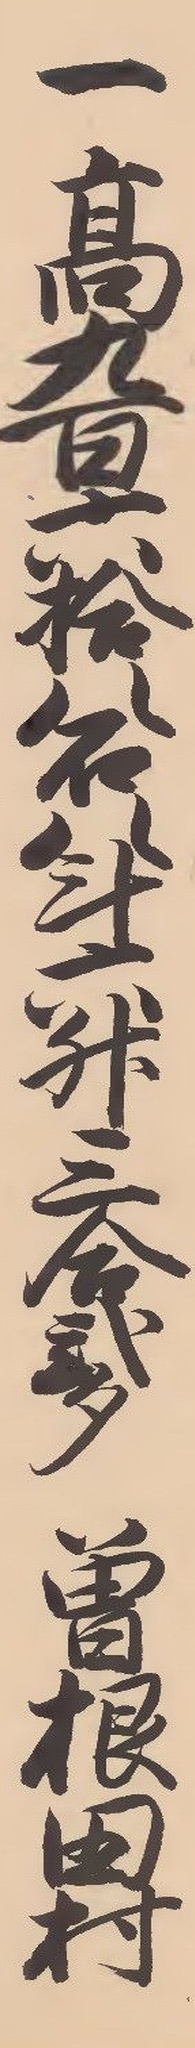一高九百六拾八石八斗六升三合弐勺曽根田村
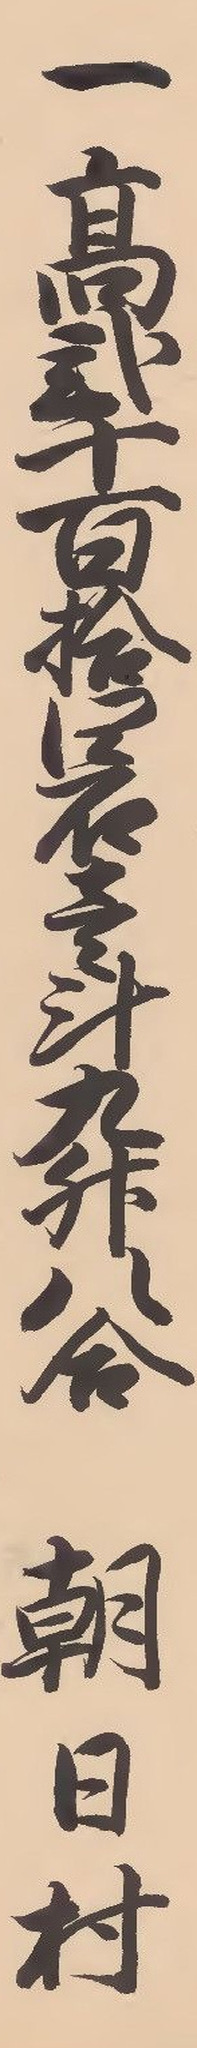一高弐千百拾四石壱斗九升八合朝日村

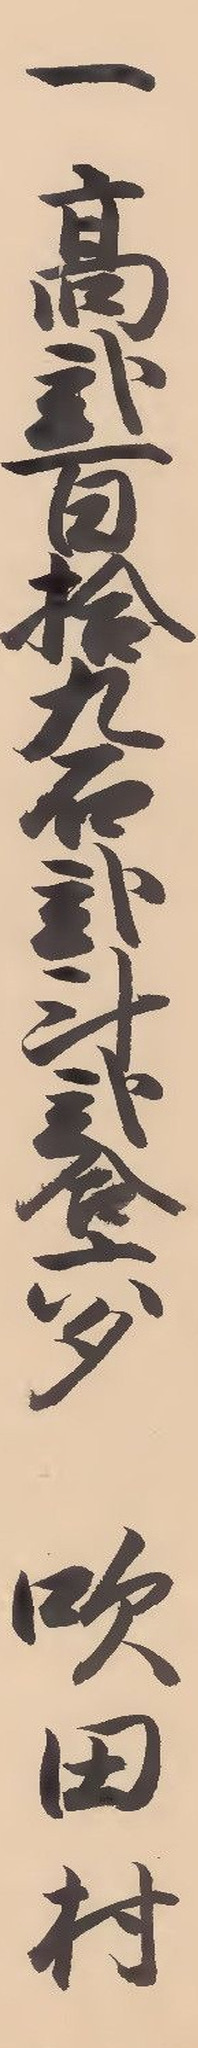一高弐百拾九石弐斗弐合六勺吹田村
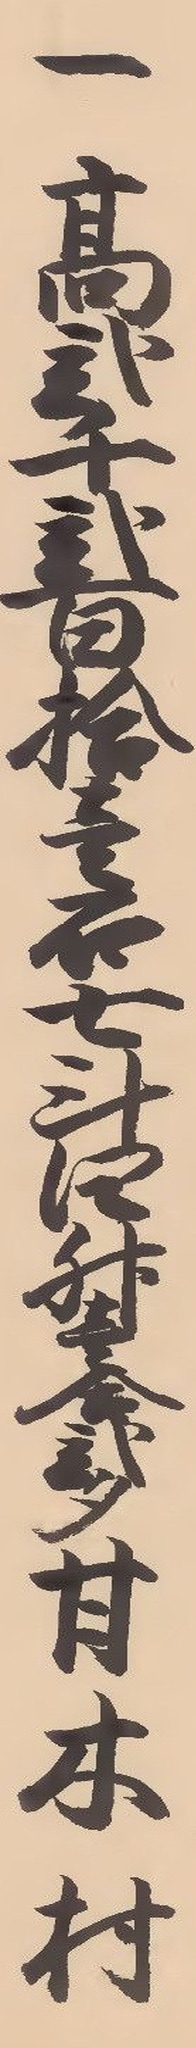一高弐千弐百拾壱石七斗四升壱合弐勺甘木村
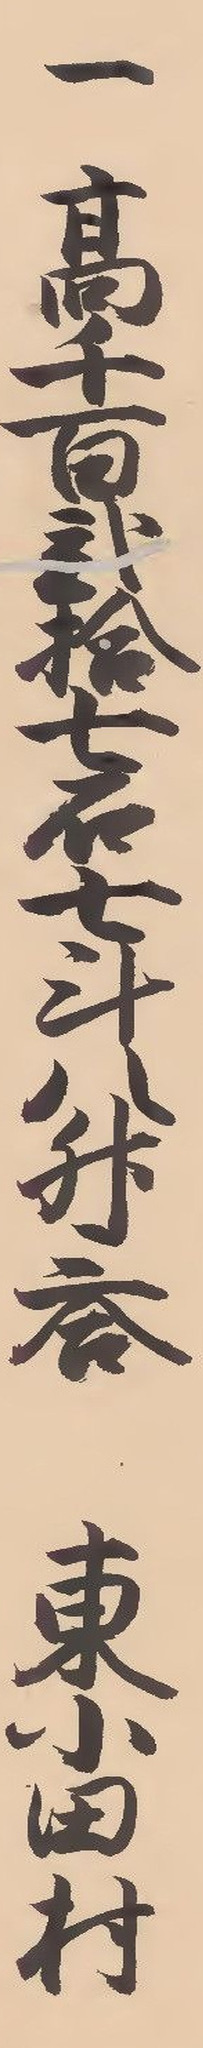一高千百弐拾七石七斗八升三合東小田村
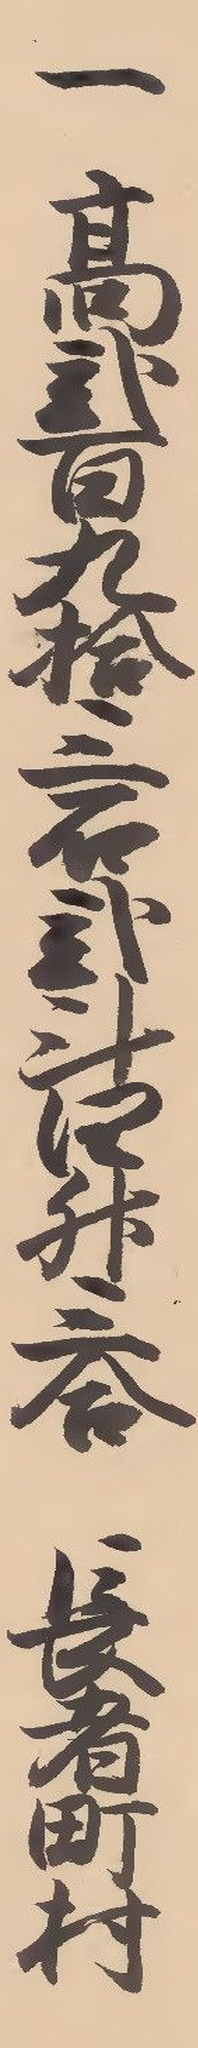一高弐百九拾三石弐斗四升三合長者町村
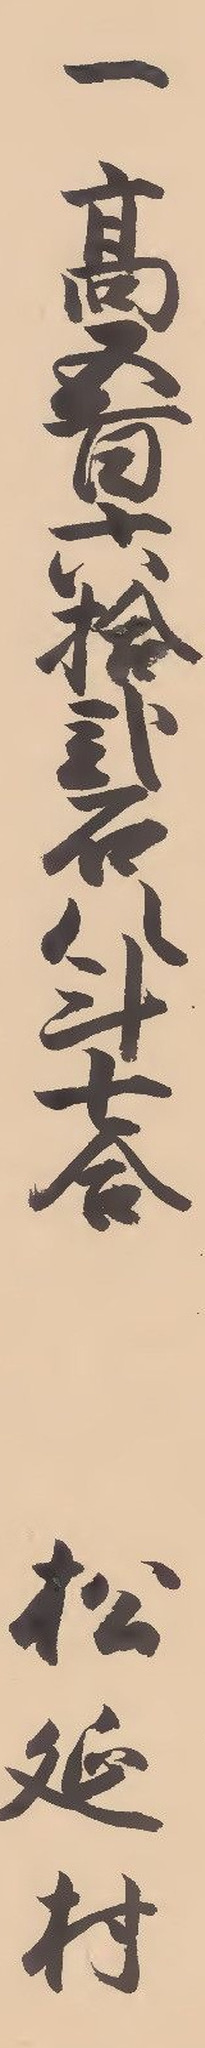一高五百六拾弐石八斗七合松延村
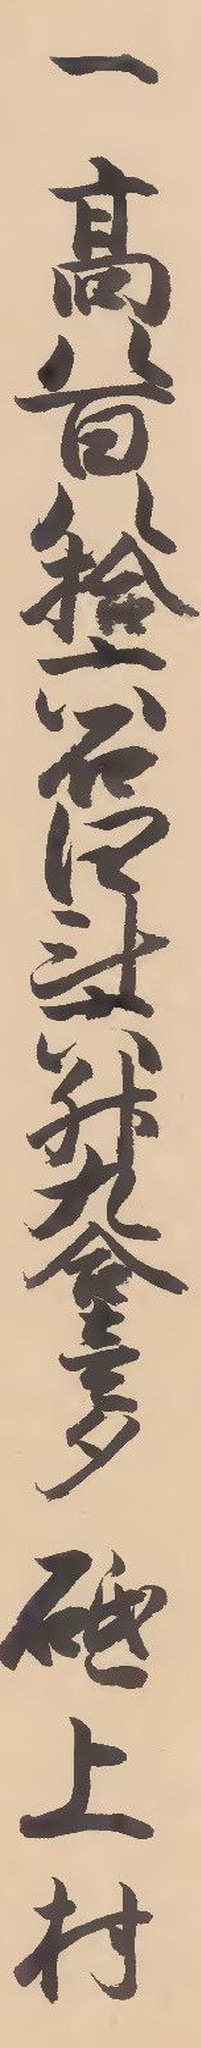一高八百八拾六石四斗六升九合壱勺砥上村

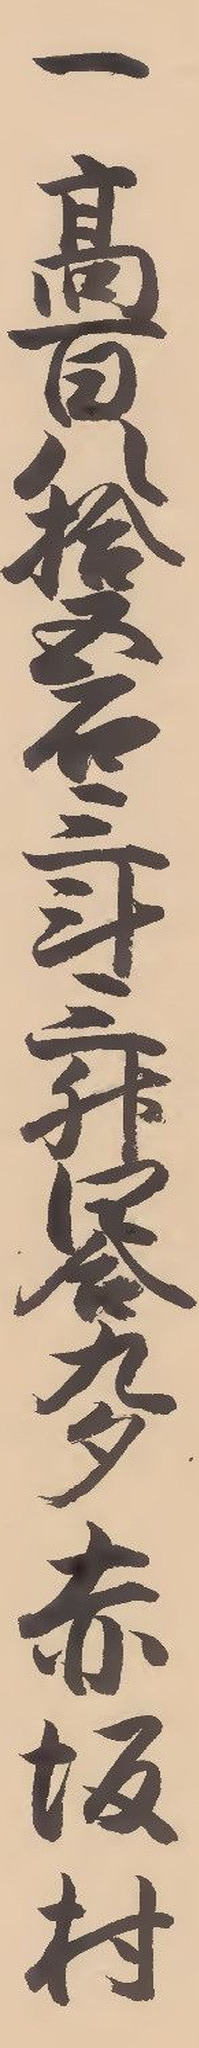一高百八拾五石三斗三升四合九勺赤坂村
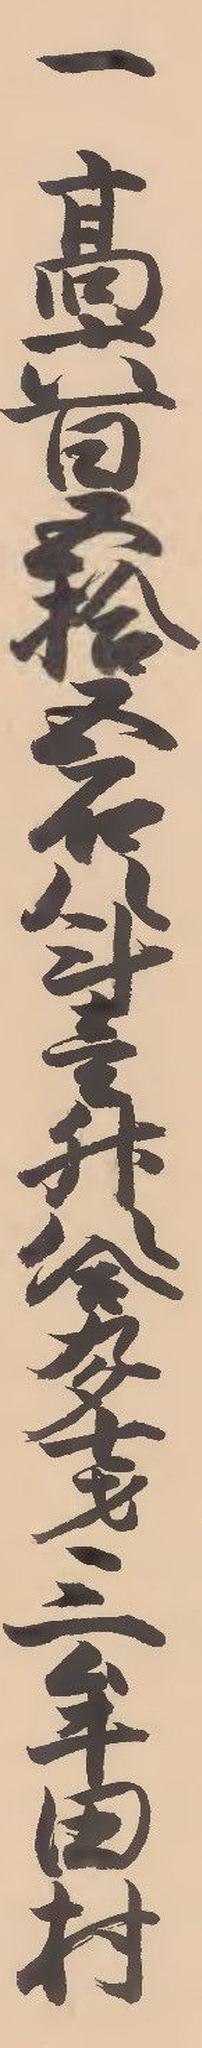一高六百五拾五石八斗壱升八合九勺七才三牟田村
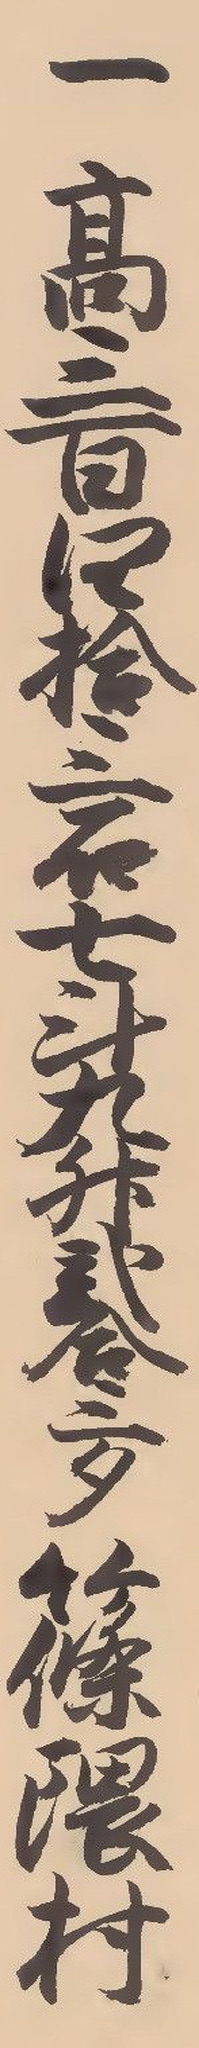一高三百四拾三石七斗九升弐合三勺篠隈村
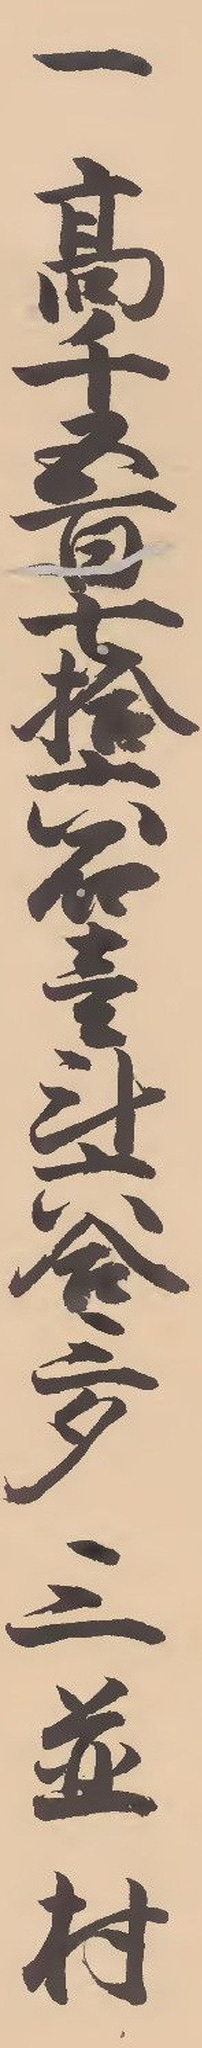一高千五百七拾六石壱斗六合三勺三並村
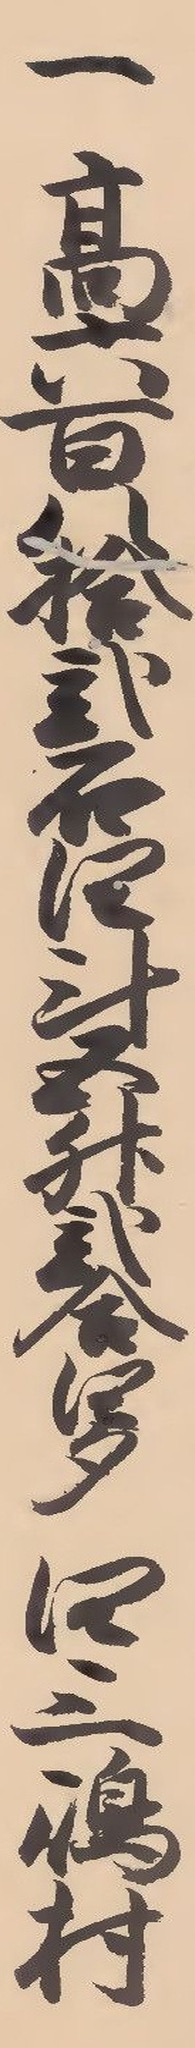一高六百八拾弐石四斗五升弐合四勺四三島村
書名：筑前国郷帳
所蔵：国立公文書館 National Archives of Japan
